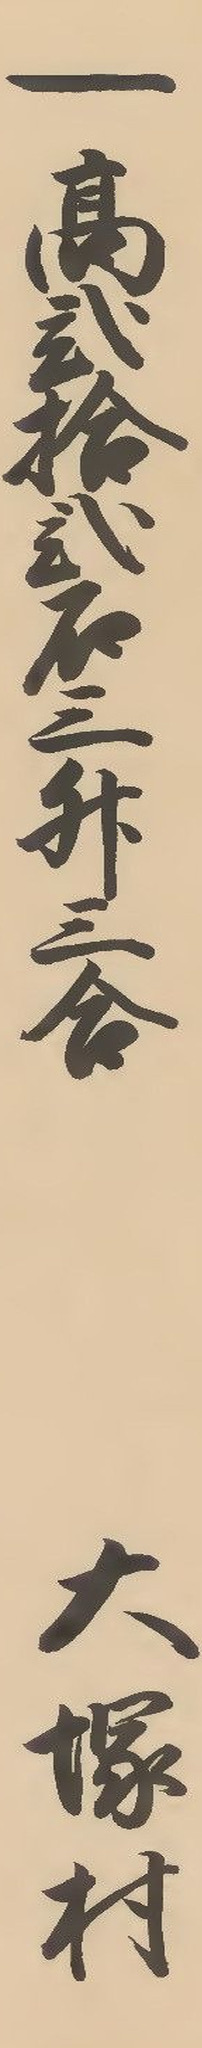一高弐拾弐石三升三合大塚村
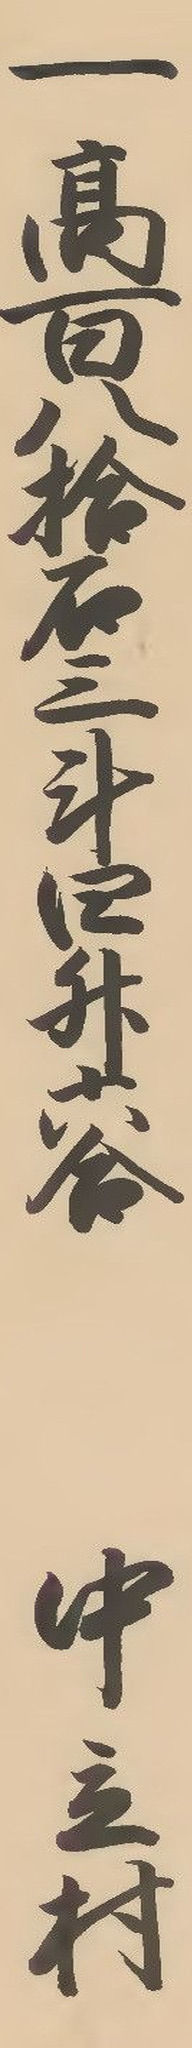一高百八拾石三斗四升六合中立村

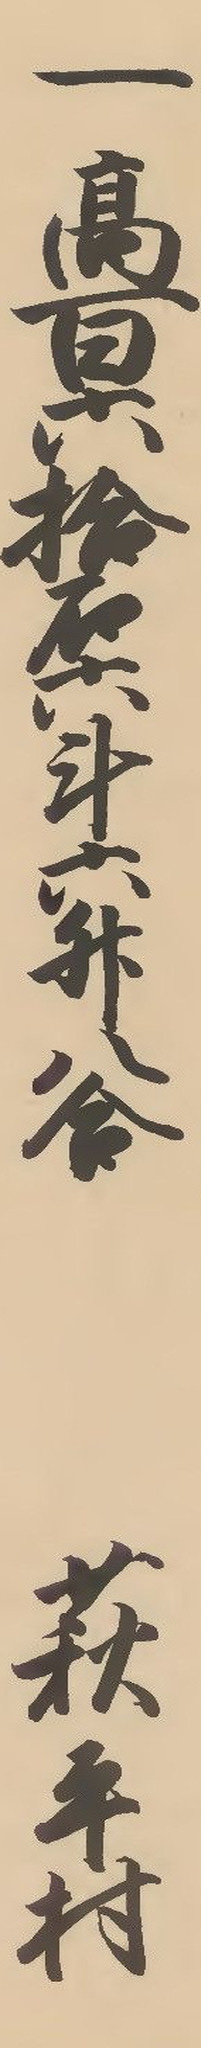一高百六拾石六斗六升八合萩平村
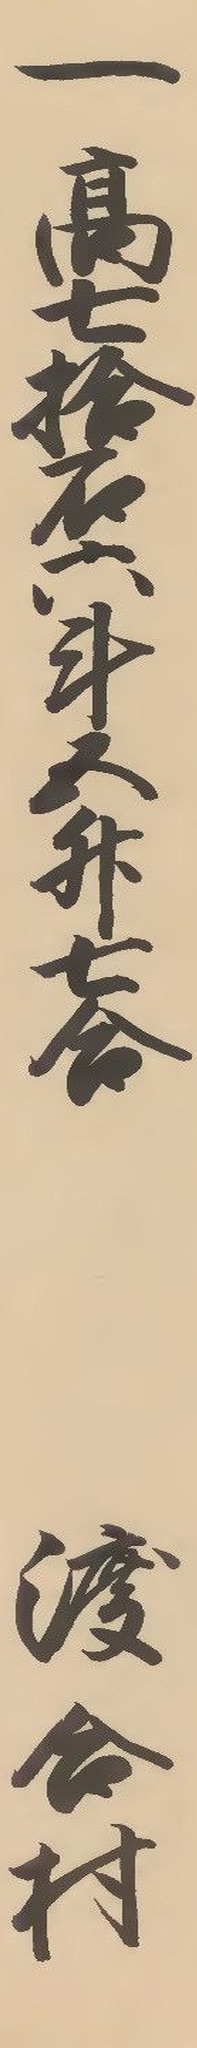一高七拾石六斗五升七合渡合村
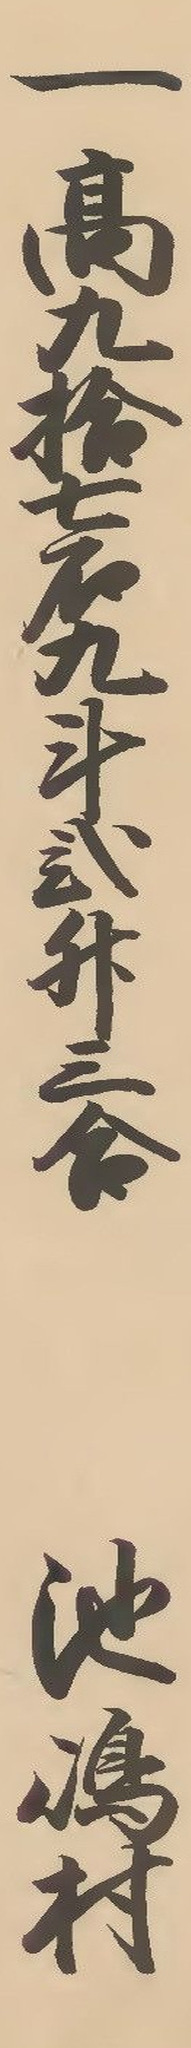一高九拾七石九斗弐升三合池島村
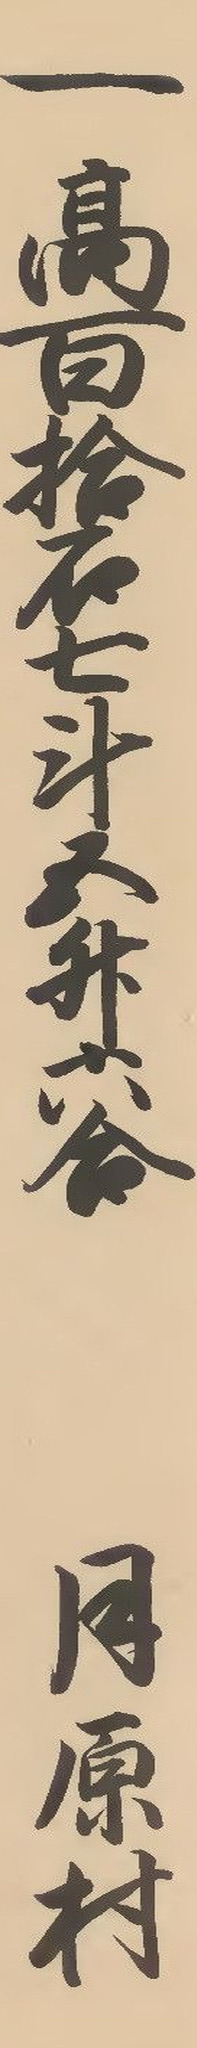一高百拾石七斗五升六合月原村
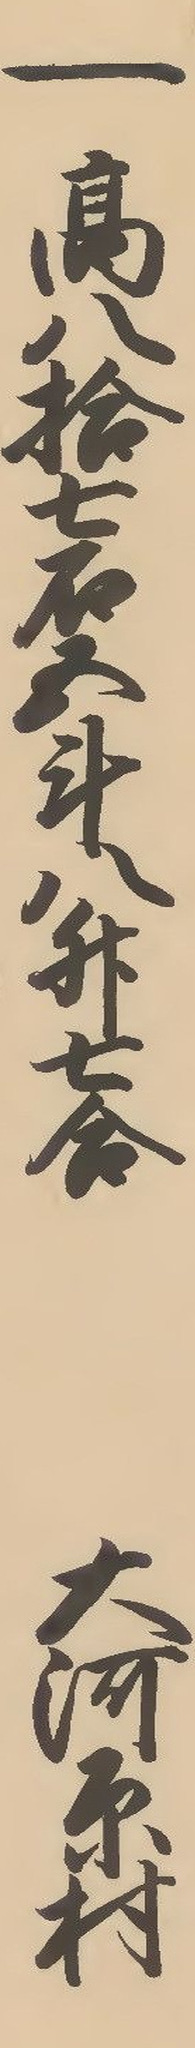一高八拾七石五斗八升七合大河原村
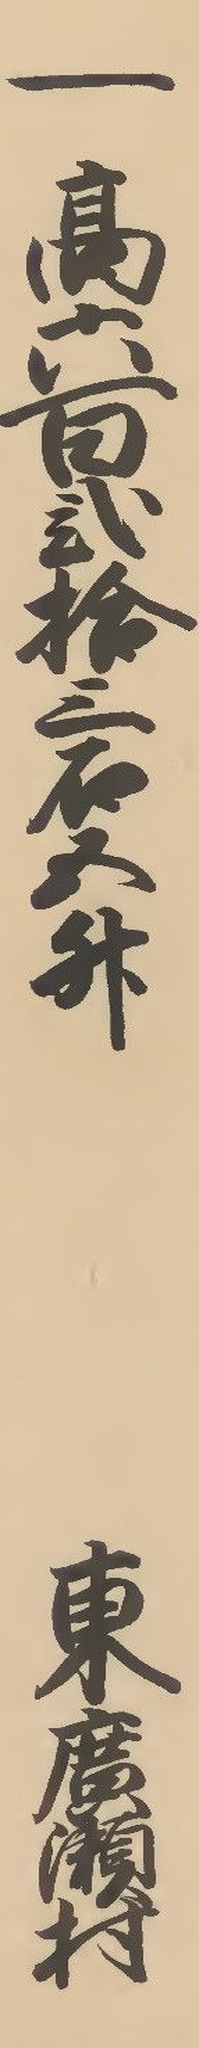一高六百弐拾三石五升東広瀬村
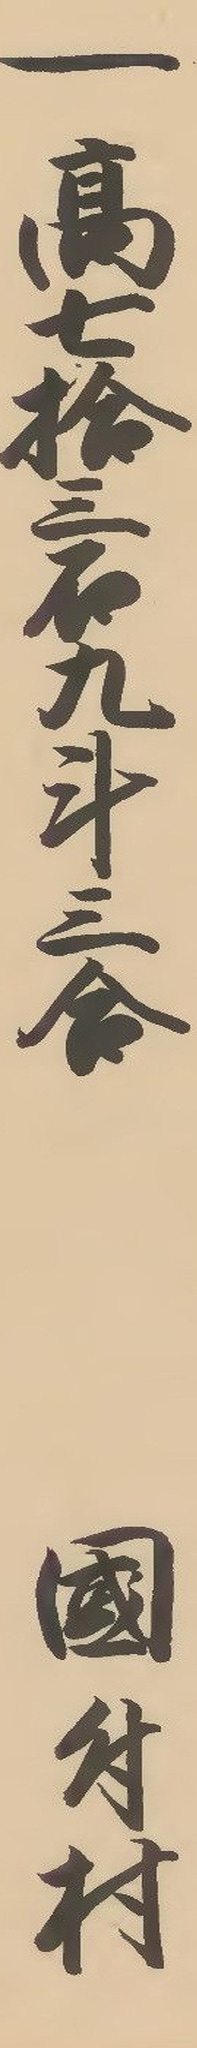一高七拾三石九斗三合国付村

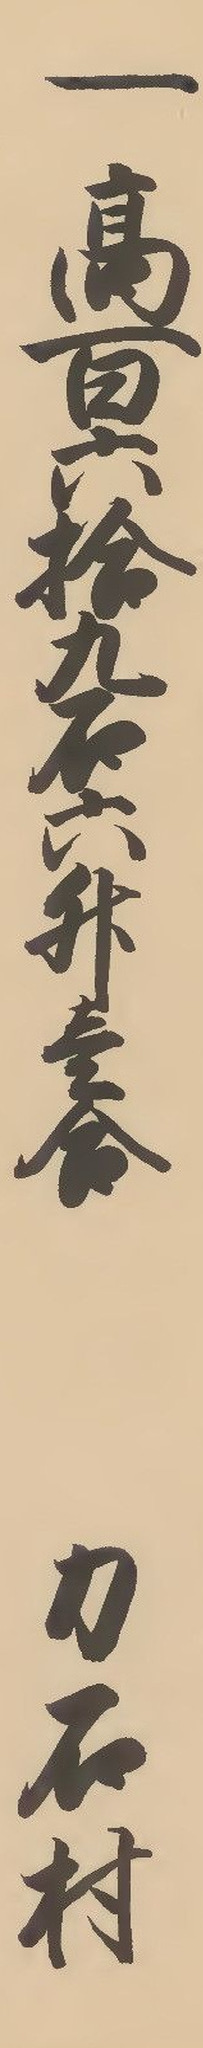一高百六拾九石六升壱合力石村
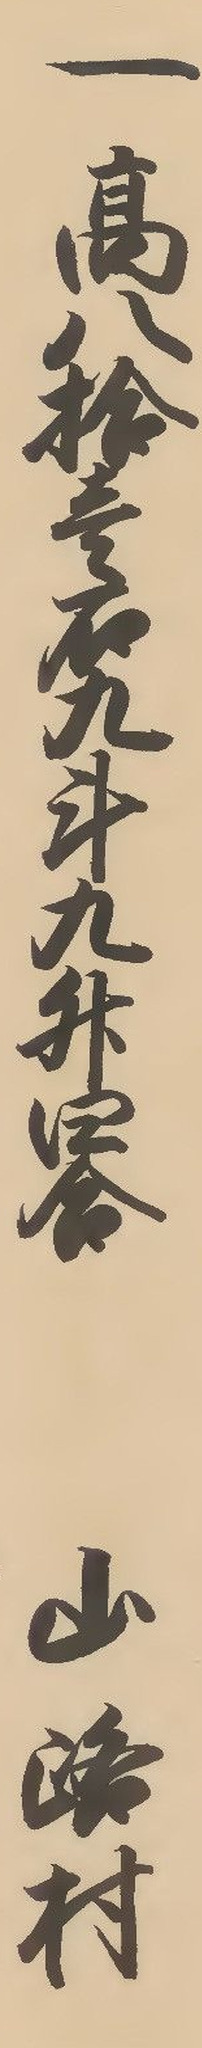一高八拾壱石九斗九升四合山路村
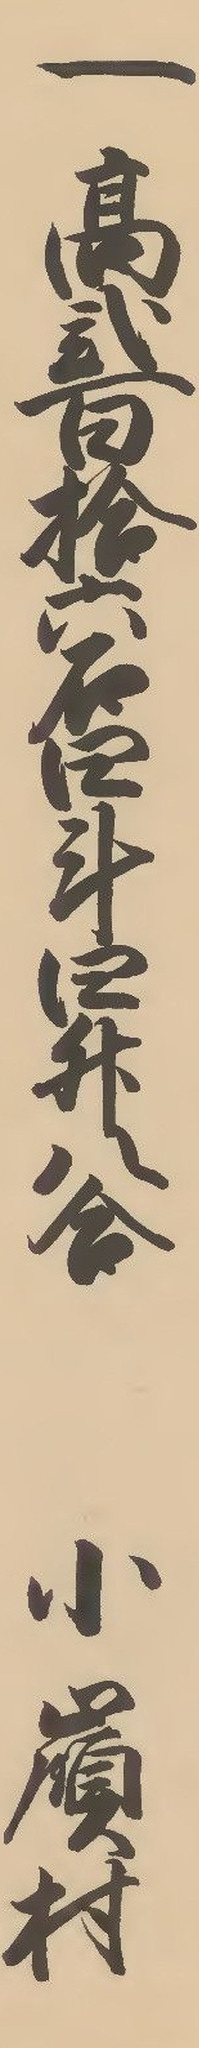一高弐百拾六石四斗四升八合小嶺村
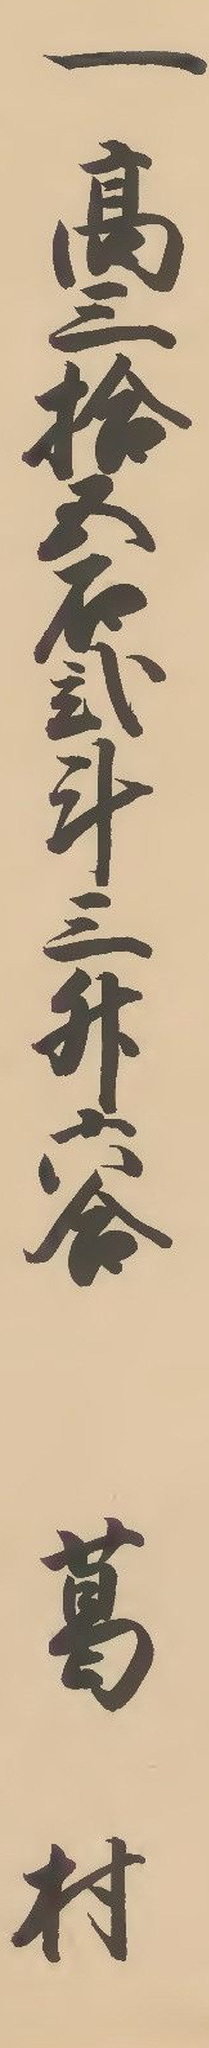一高三拾五石弐斗三升六合葛村
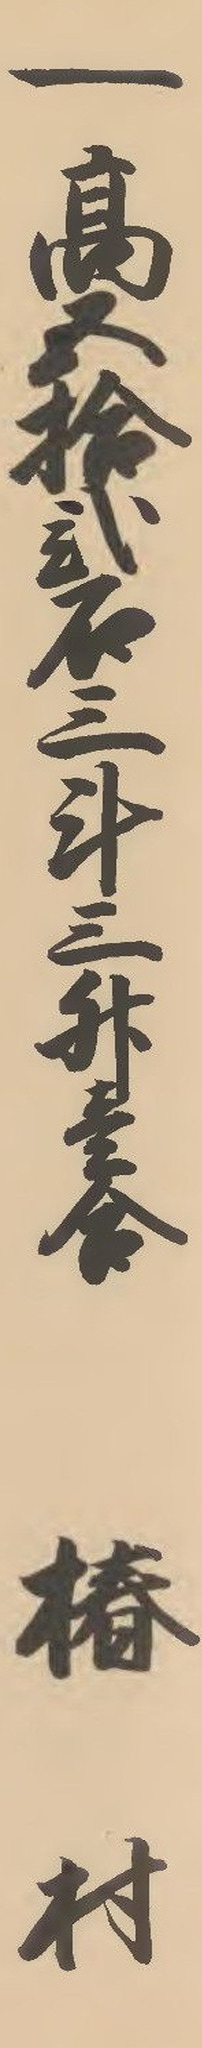一高五拾弐石三斗三升壱合椿村
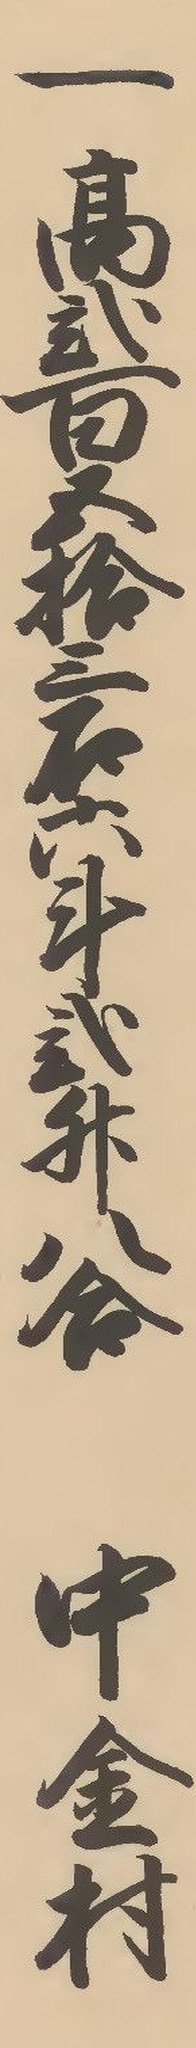一高弐百五拾三石六斗弐升八合中金村
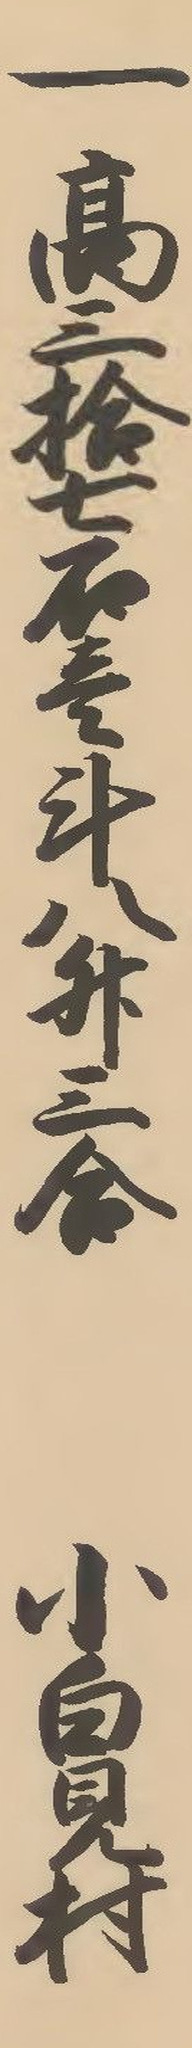一高三拾七石壱斗八升三合小白見村
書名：三河国郷帳
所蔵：国立公文書館 National Archives of Japan
